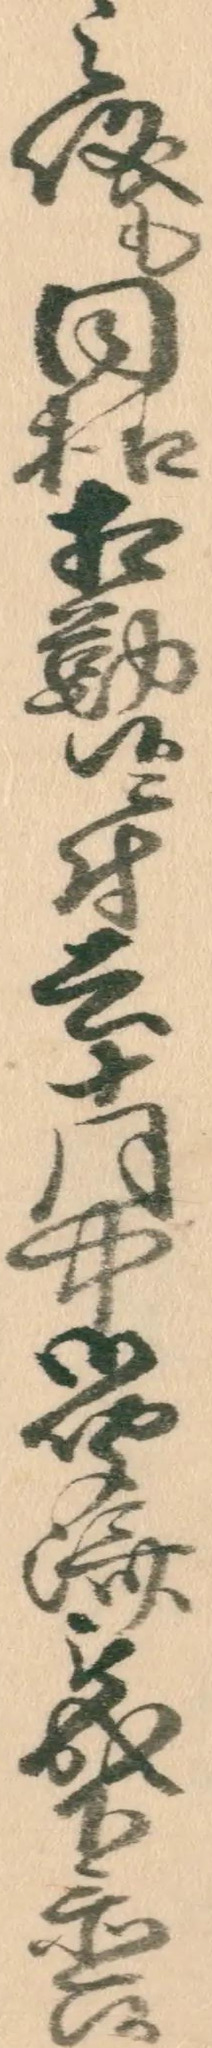之儀も同様相勤候ニ付去十月中御聞済被成下置候
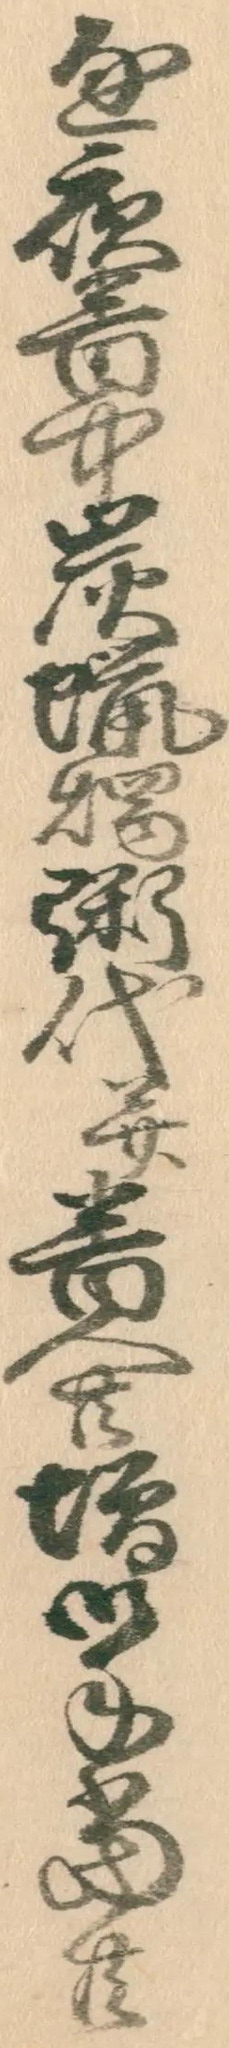通夜番中炭蝋燭粥代并番人共増御手当共
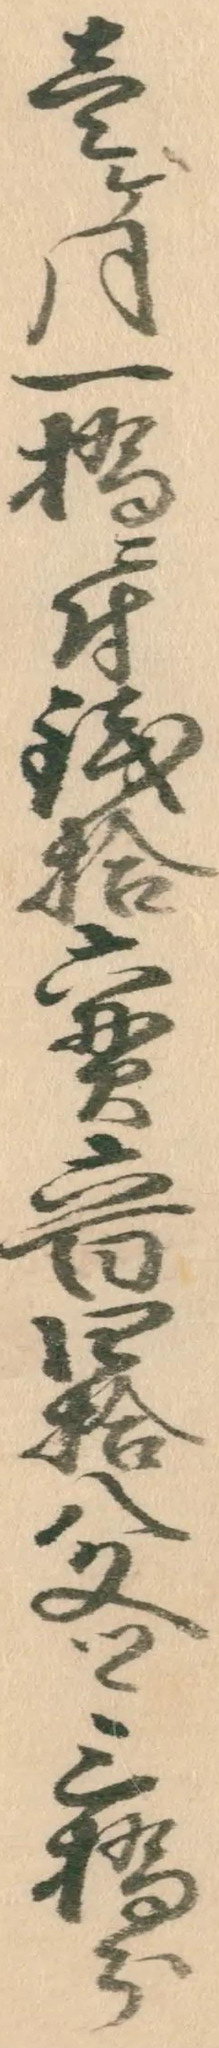壱ケ月一橋ニ付銭拾六貫六百四拾八文ツヽ三橋分

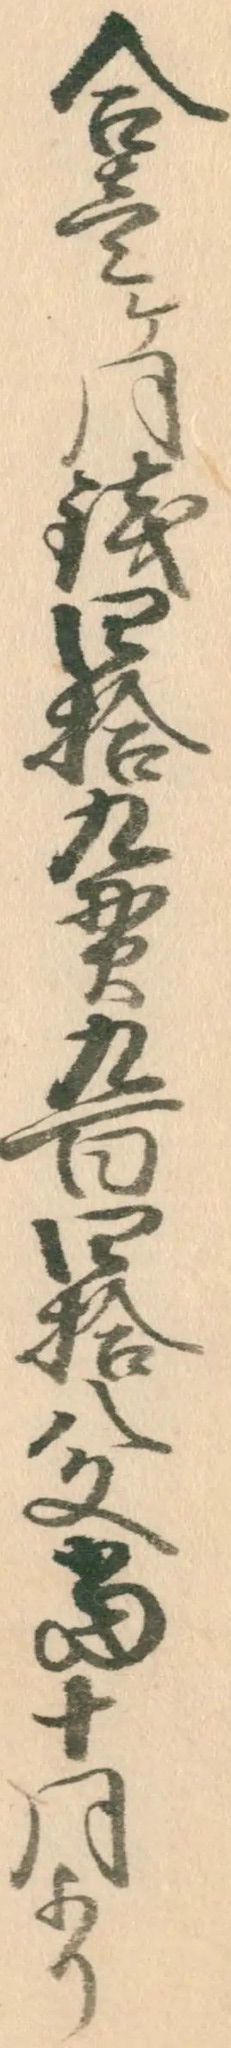合壱ケ月銭四拾九貫九百四拾八文当十月より
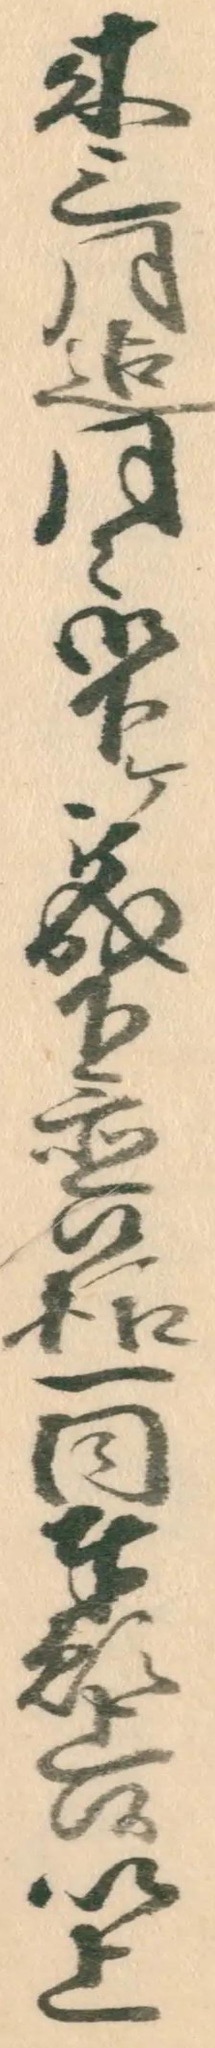来三月迄月々御下ケ被成下置候様一同奉願上候以上
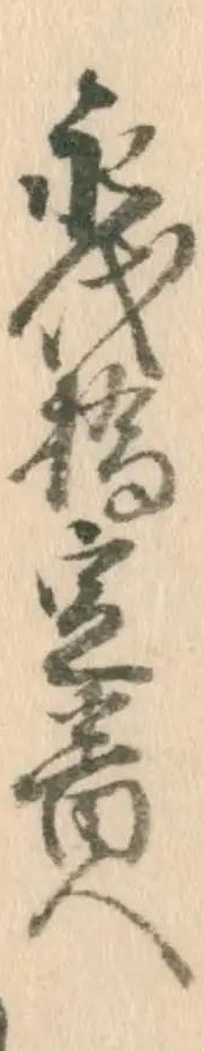永代橋定番人
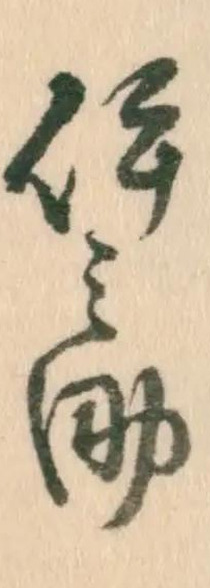伊之助
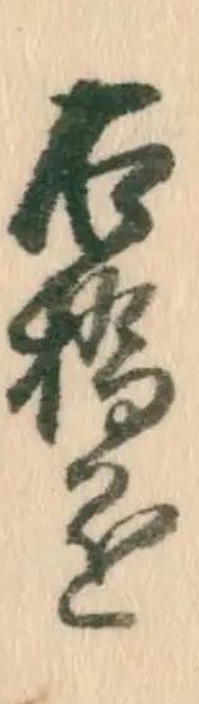右橋懸
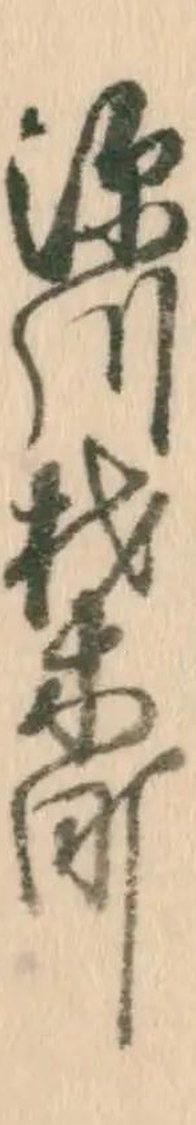深川材木町
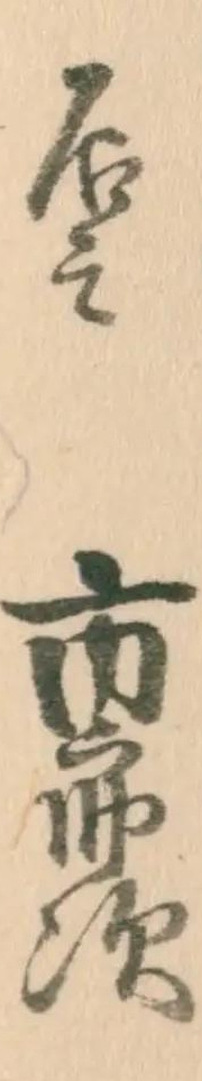名主市郎次
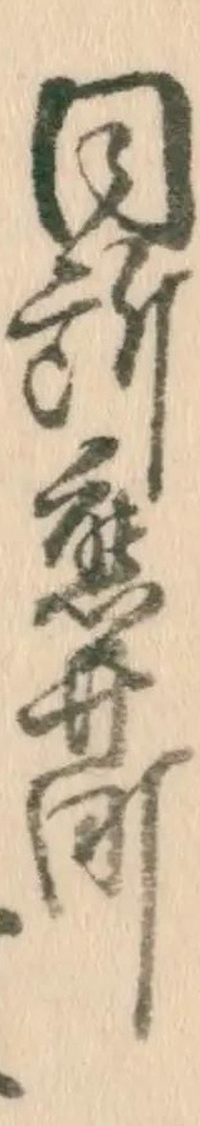同所熊井町
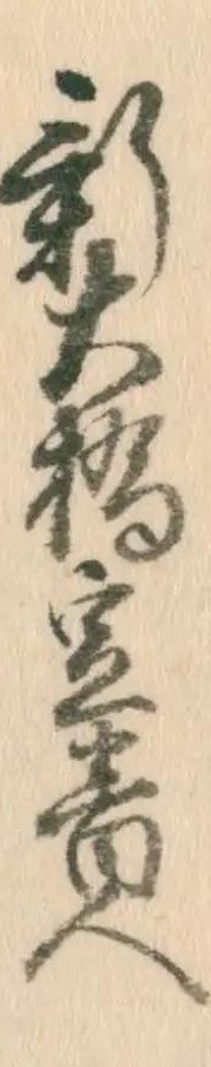新大橋定番人
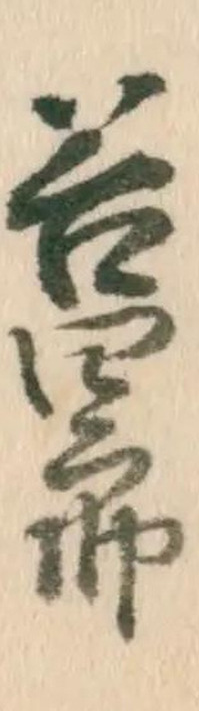善四郎
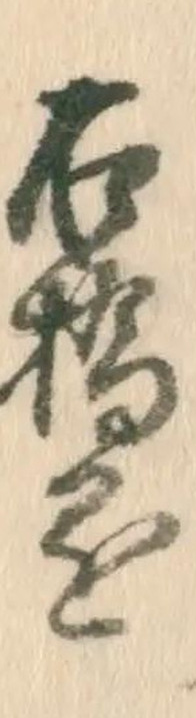右橋懸
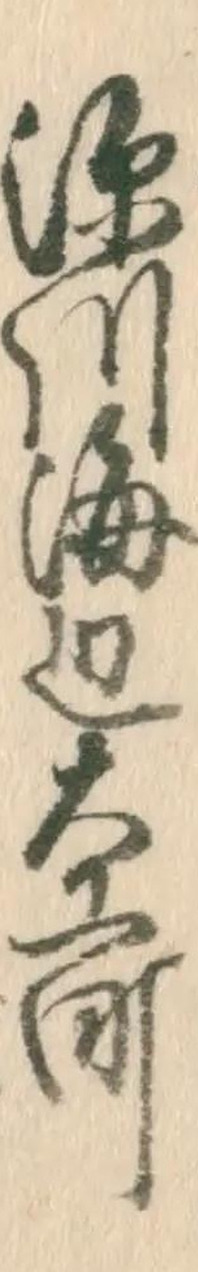深川海辺大工町
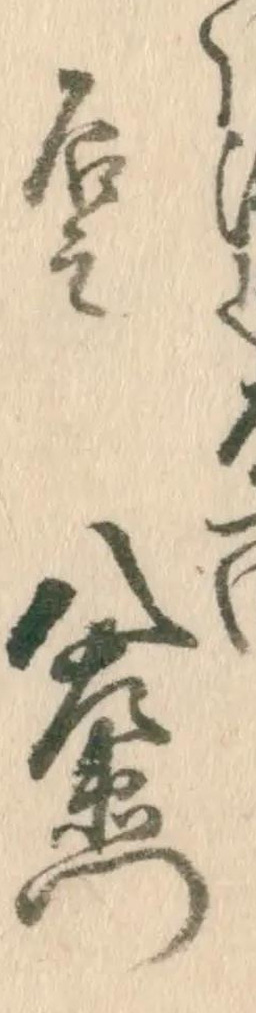名主八左衛門
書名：三橋 17巻. [7] 三橋小破御修復書留　但御奉行御掛リ替地震潰橋番屋　嘉永四亥年より安政二卯年迄　上
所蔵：国立国会図書館 National Diet Library, JAPAN
